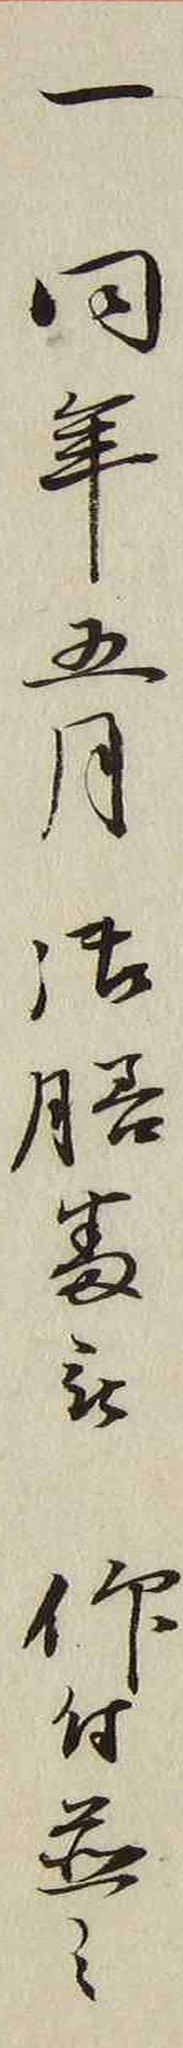一同年五月御膳番被仰付並之
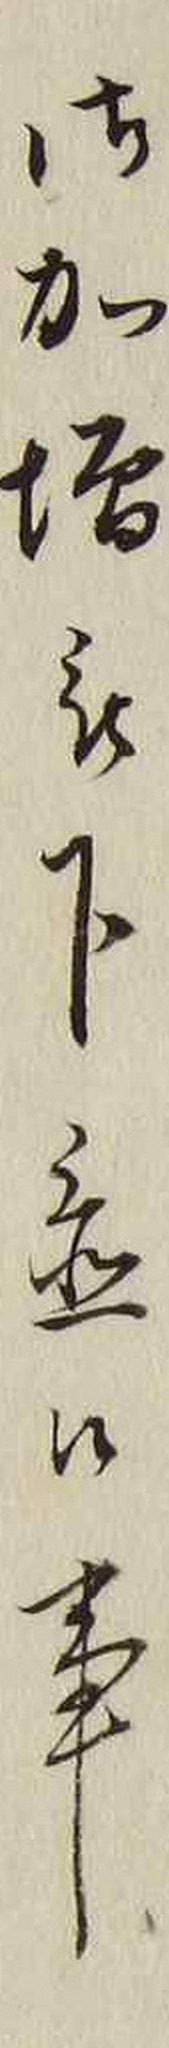御加増被下置候事
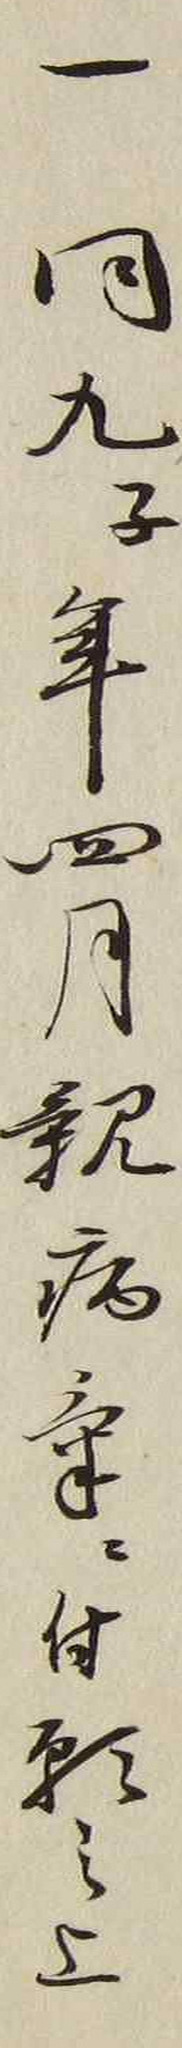一同九子年四月親病気ニ付願之上
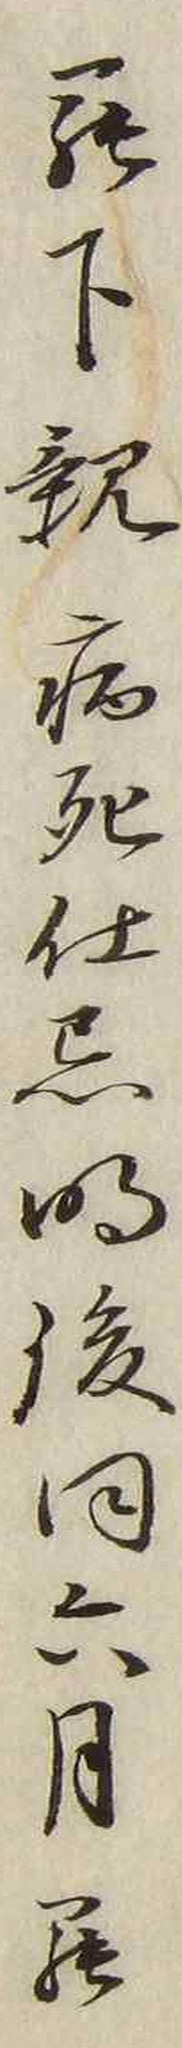罷下親病死仕忌明後同六月罷

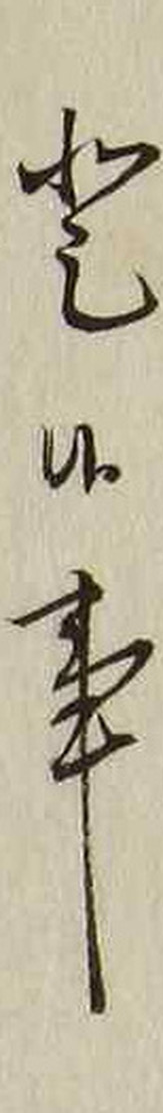登候事
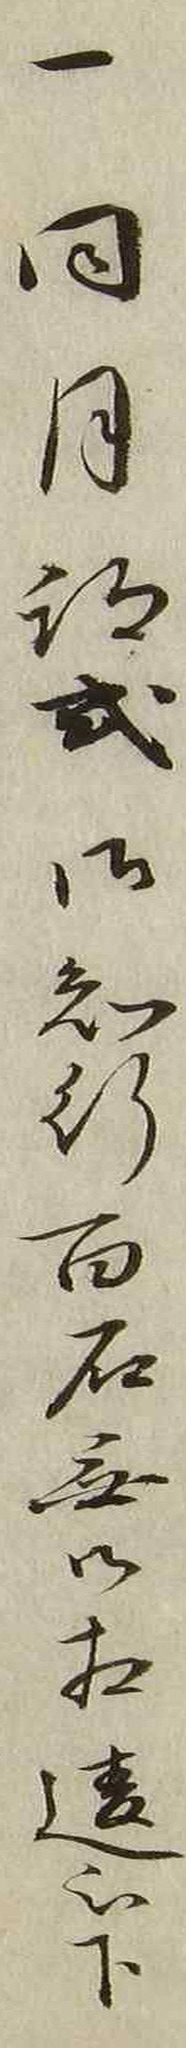一同月跡式御知行百石無御相違被下
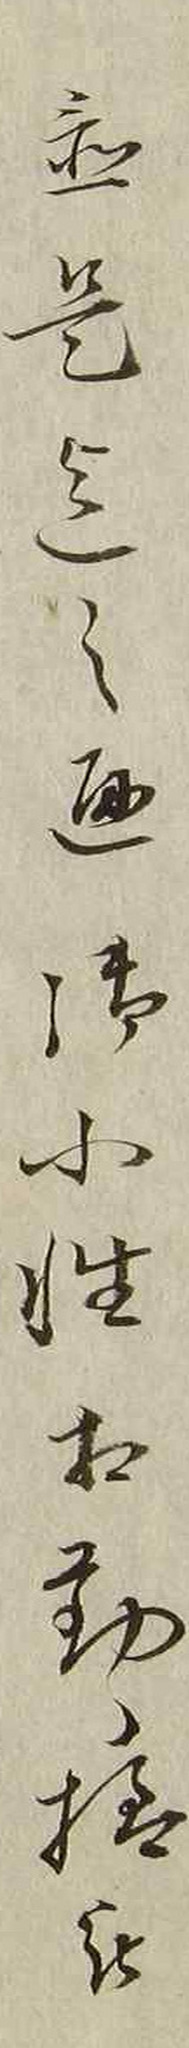置是迄之通御小性相勤候様被
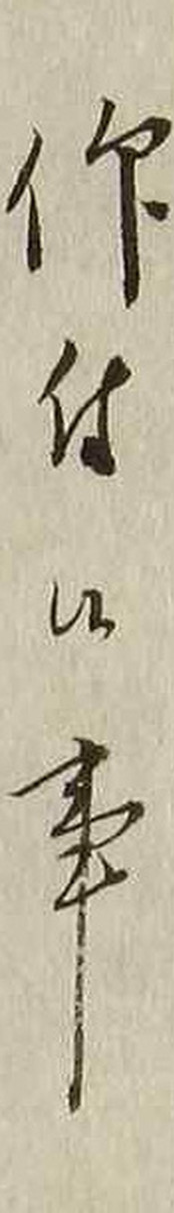仰付候事
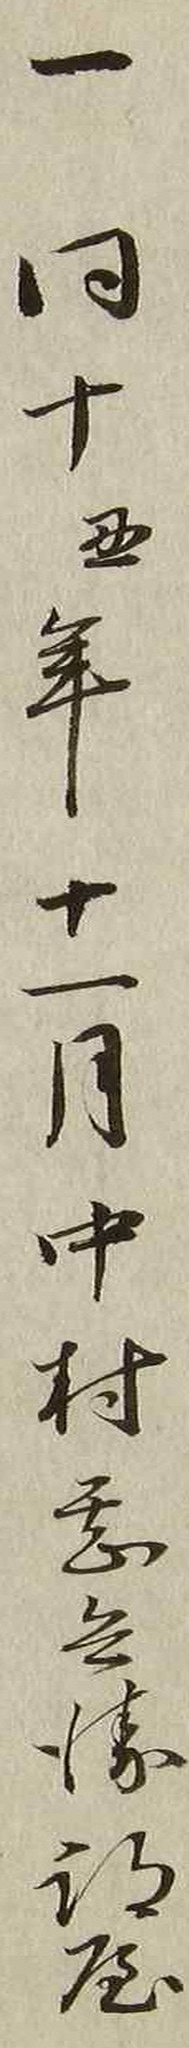一同十丑年十一月中村甚兵隣跡屋
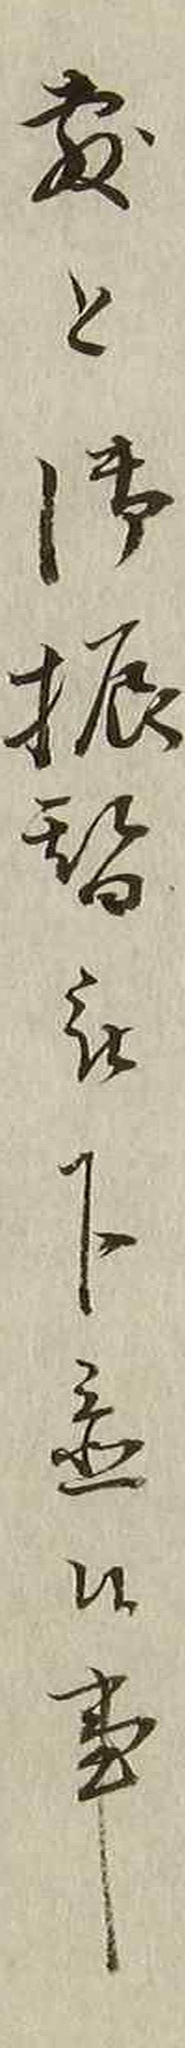敷と御振替被下置候事
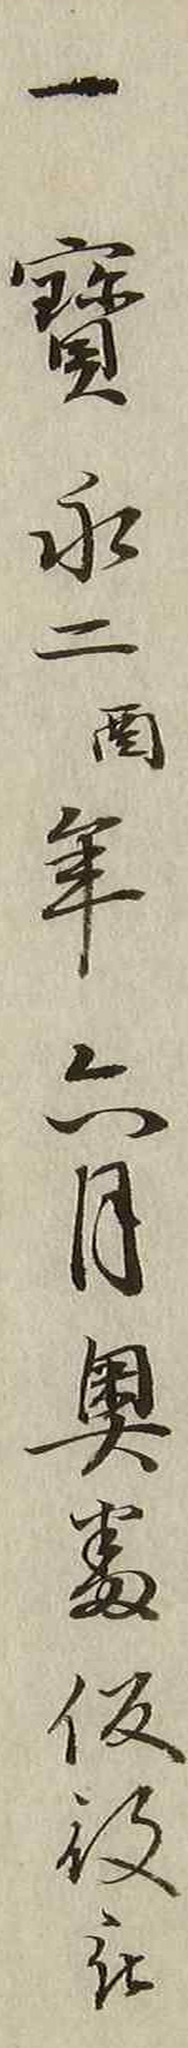一宝永二酉年六月奥番仮役被
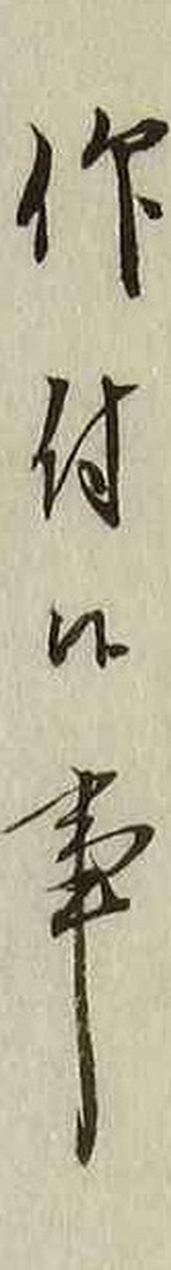仰付候事
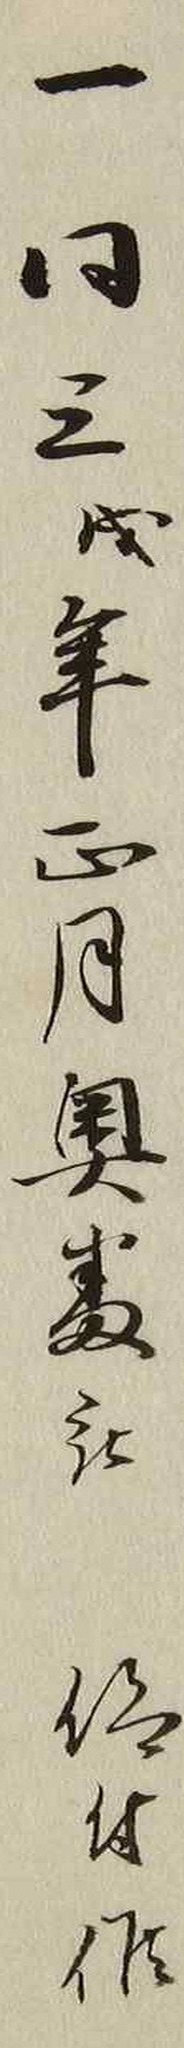一同三戌年正月奥番被仰付候
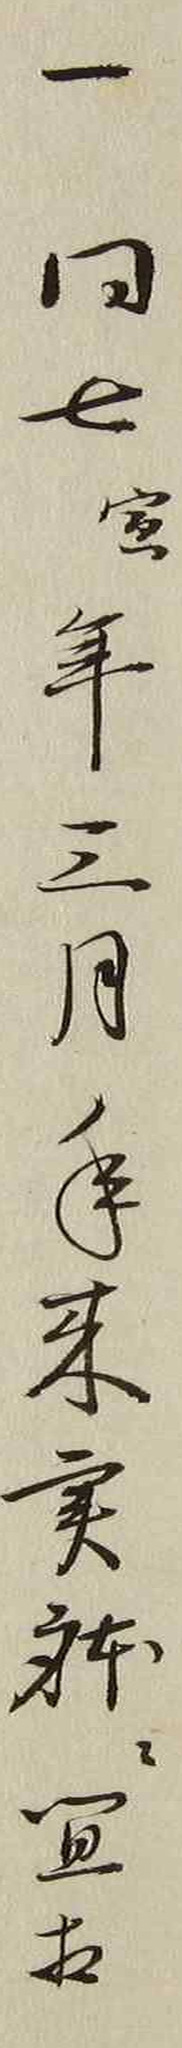一同七寅年三月年来実体ニ宜相
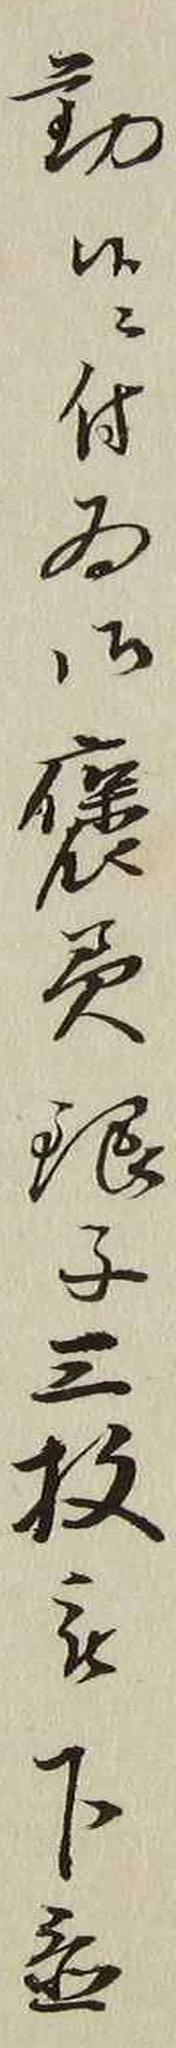勤候ニ付為御褒美銀子三枚被下置
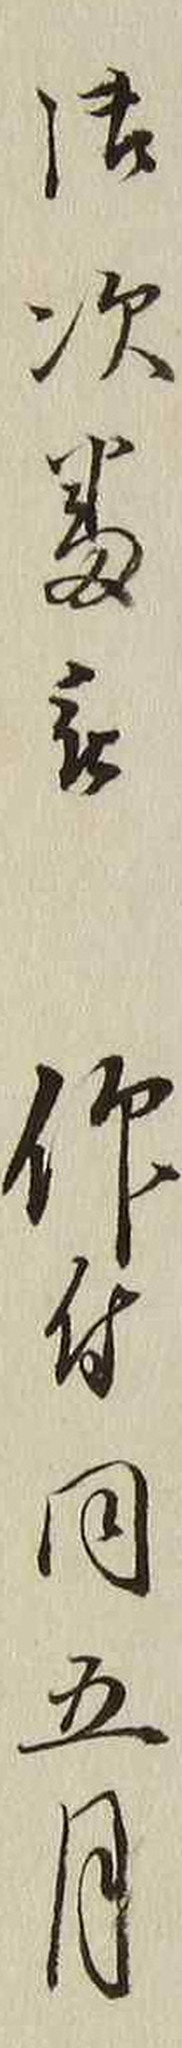御次番被仰付同五月
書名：諸士系譜　巻之22　い之部22
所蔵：会津若松市立会津図書館
